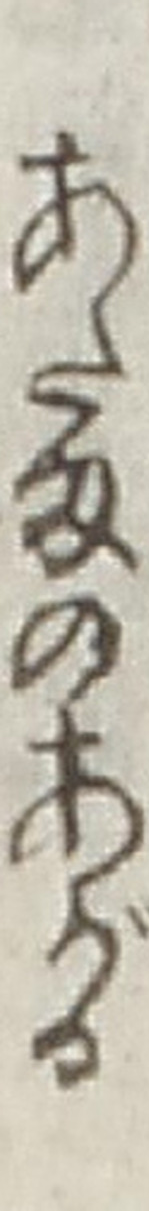あたまのあがる
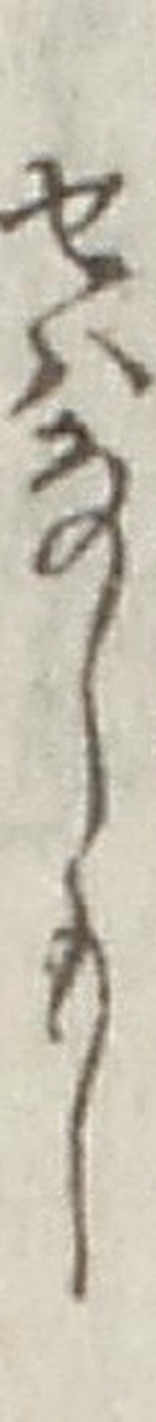せはなしもし
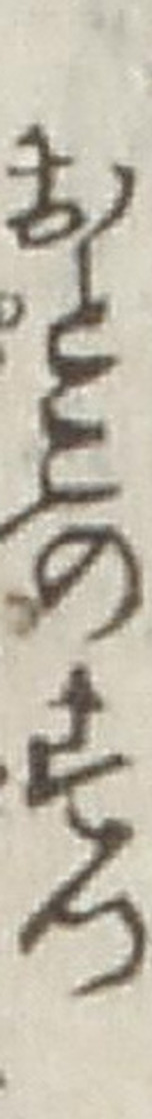おとこのすつ
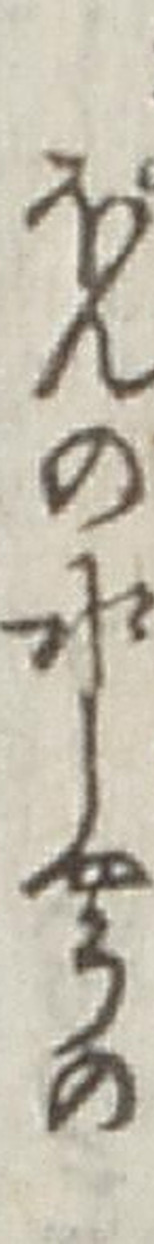ぽんの水しやうの
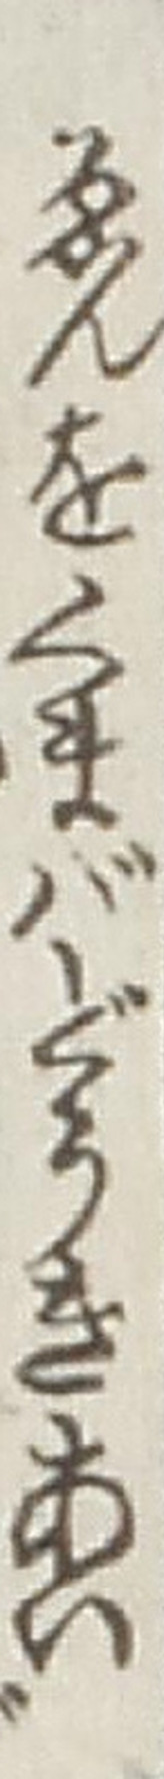ゑんをくまばどうきあい
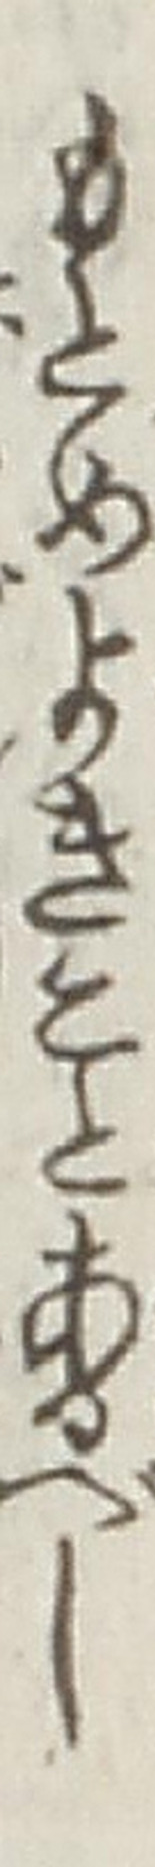もとめよきことあるべし
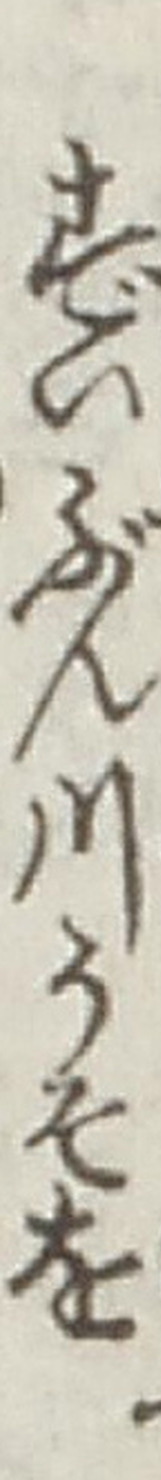ずいぶん川うそを
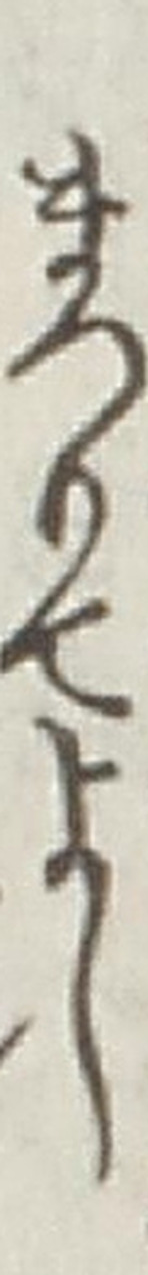まつりてよし
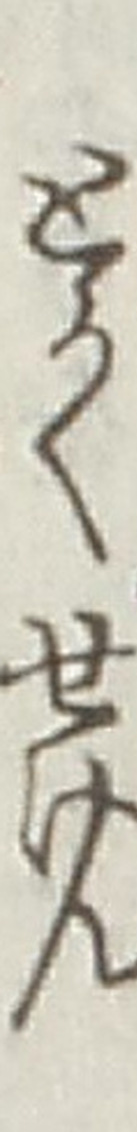とかくせけん
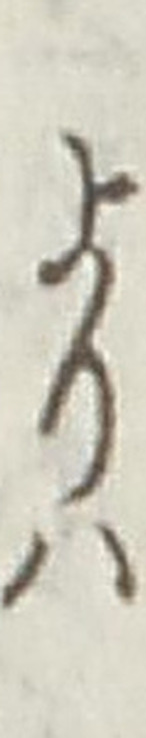よりは
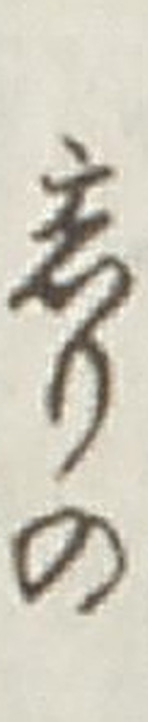しりの
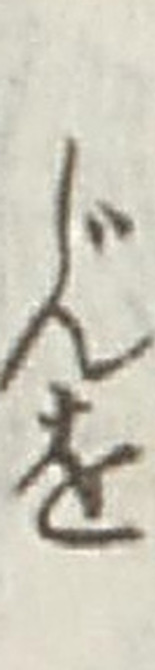じんを
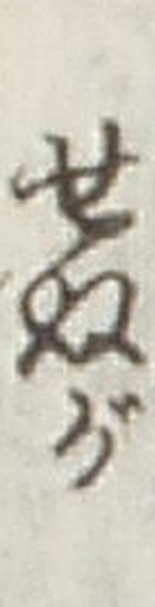せぬが
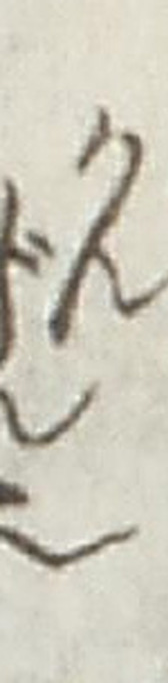じん也
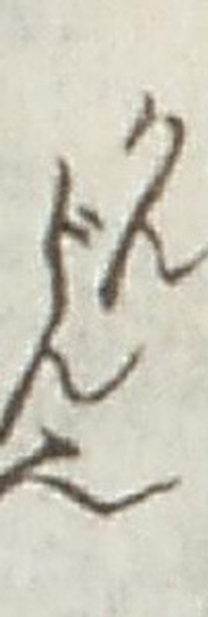じん也
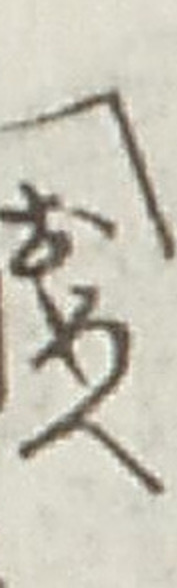〽おめへ
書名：三世相出雲當座帳　上下冊
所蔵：東京大学地震研究所図書室 Earthquake Research Institute Library, The University of Tokyo, JAPAN
